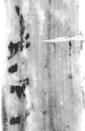朝
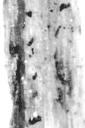啟
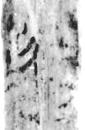閟（閉）
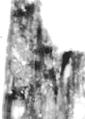○（得）
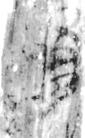晝
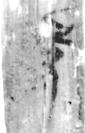○（得）
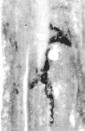○（得）
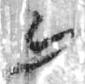㠯
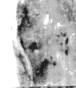㠯（以）
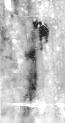又（有）
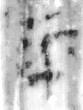疾
